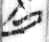㠯（以）
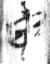串
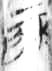戶
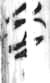秀（牖）
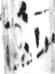○（鑿）
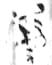井
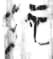行
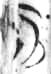水
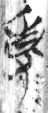事
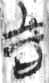吉
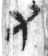又（有）
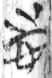志
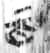百
